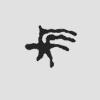長
